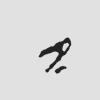{文一}
